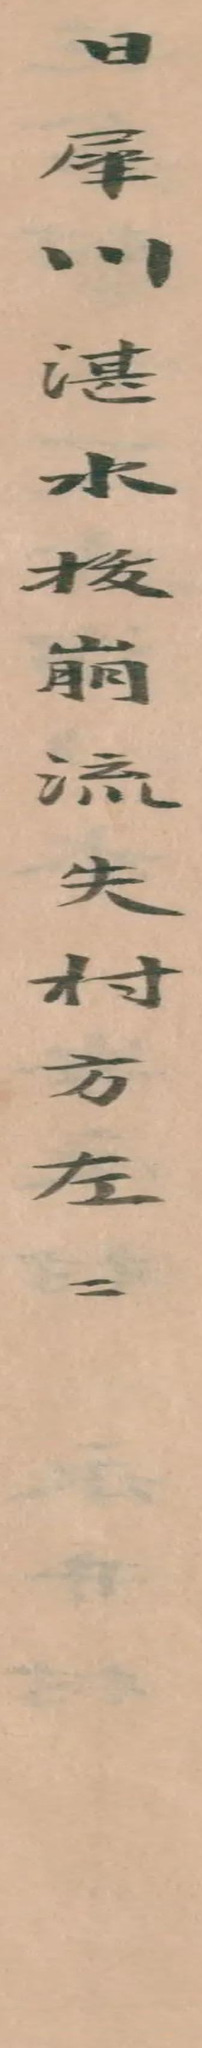日犀川湛水抜崩流失村方左ニ
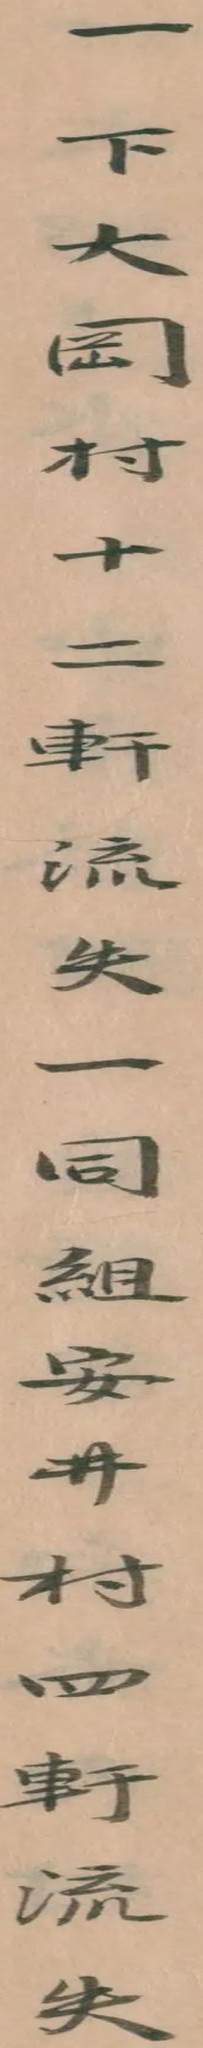一下大岡村十二軒流失一同組安井村四軒流失
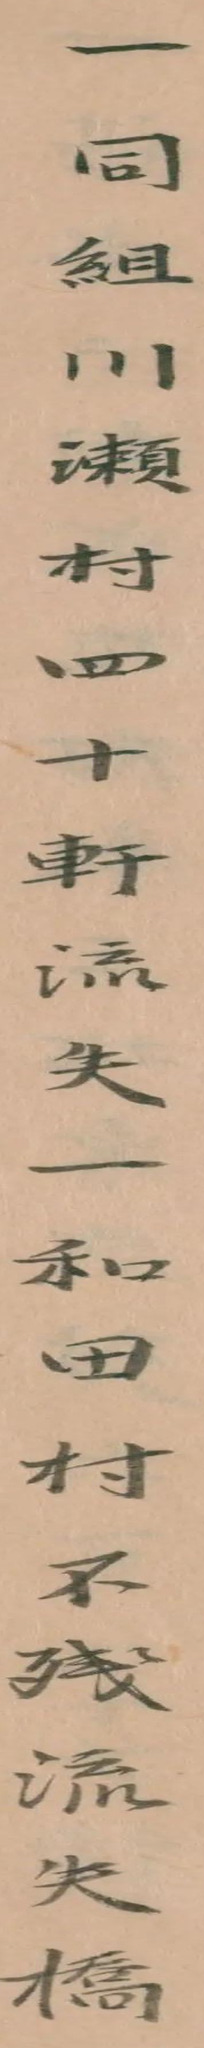一同組川瀬村四十軒流失一和田村不残流失橋
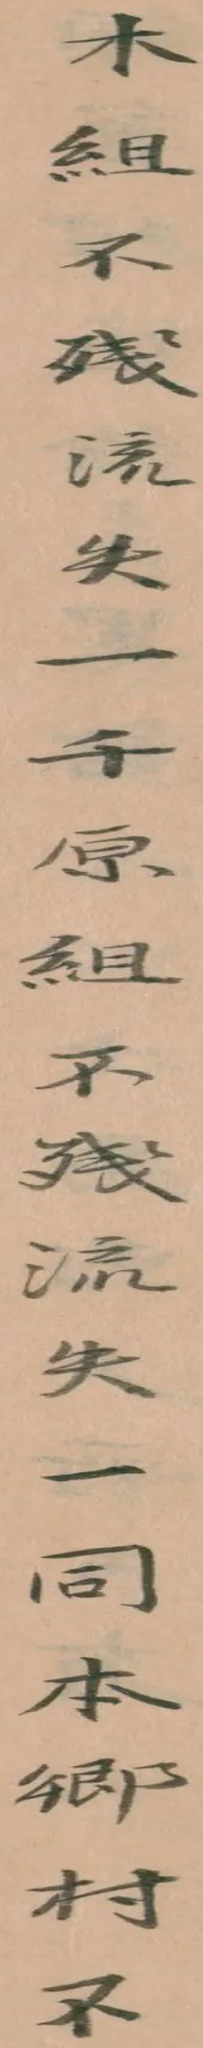木組不残流失一千原組不残流失一同本郷村不
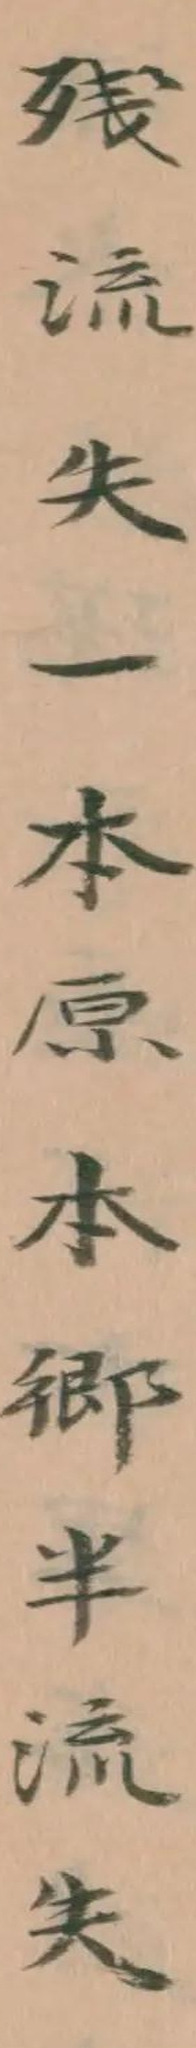残流失一本原本郷半流失
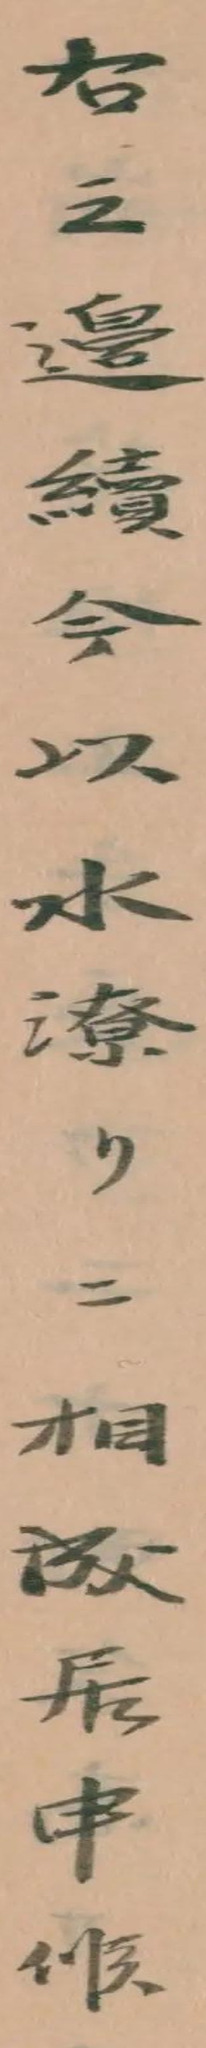右之辺続今以水潦リニ相成居申候
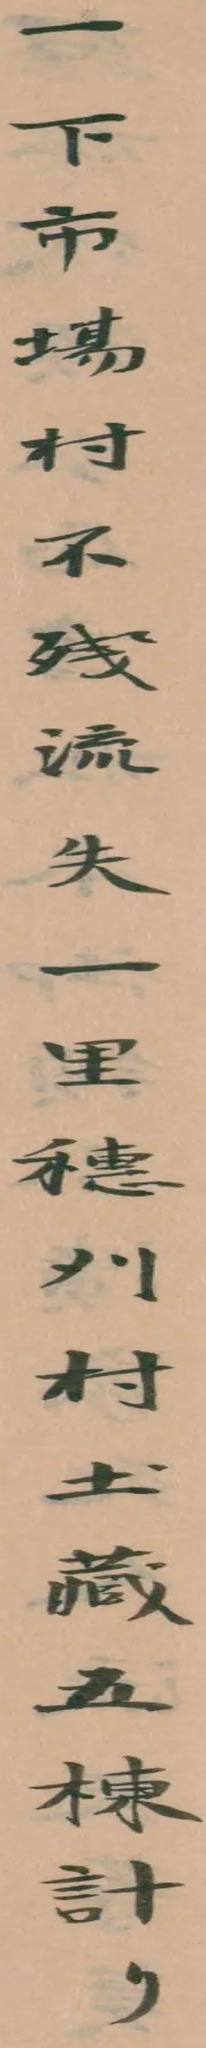一下市場村不残流失一里穂刈村土藏五棟計リ
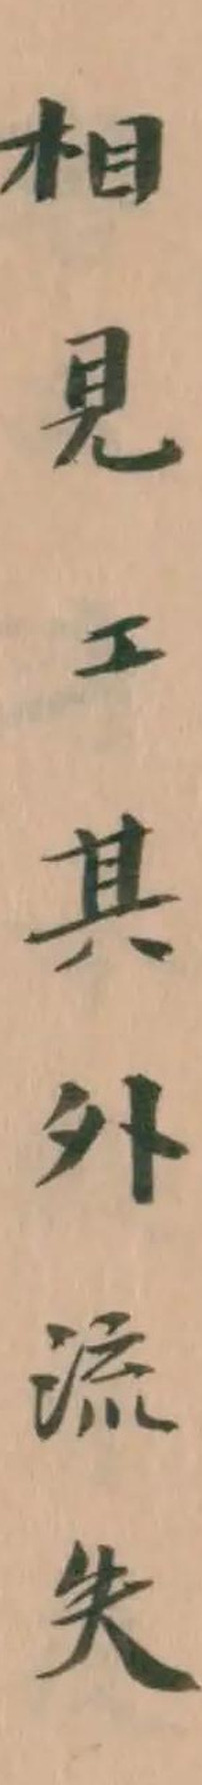相見エ其外流失
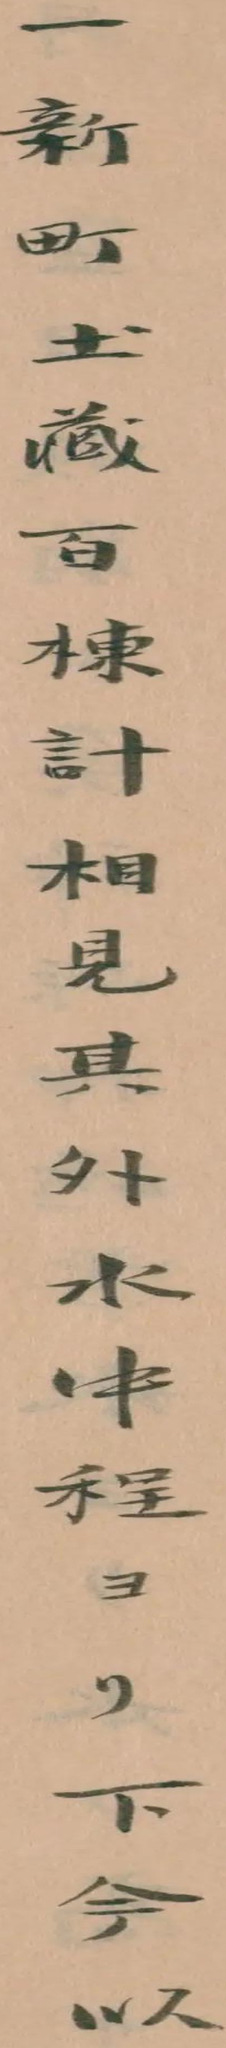一新町土藏百棟計相見其外水中程ヨリ下今以
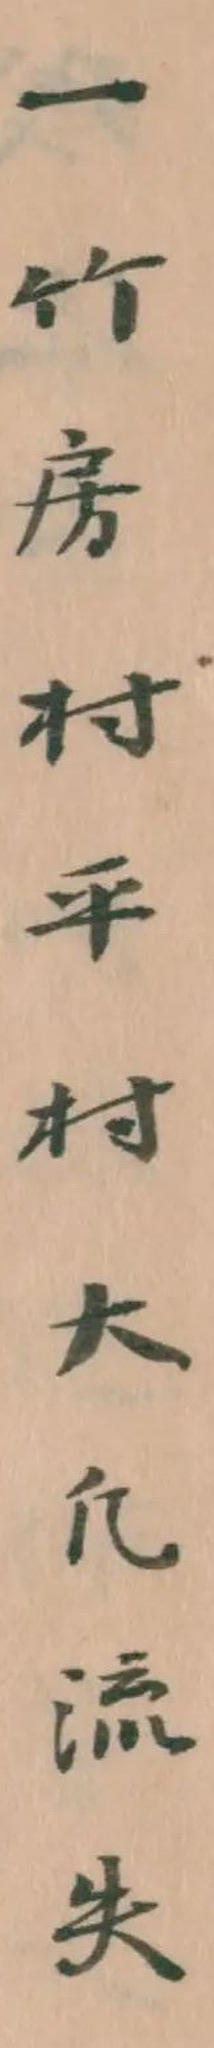一竹房村平村大凡流失
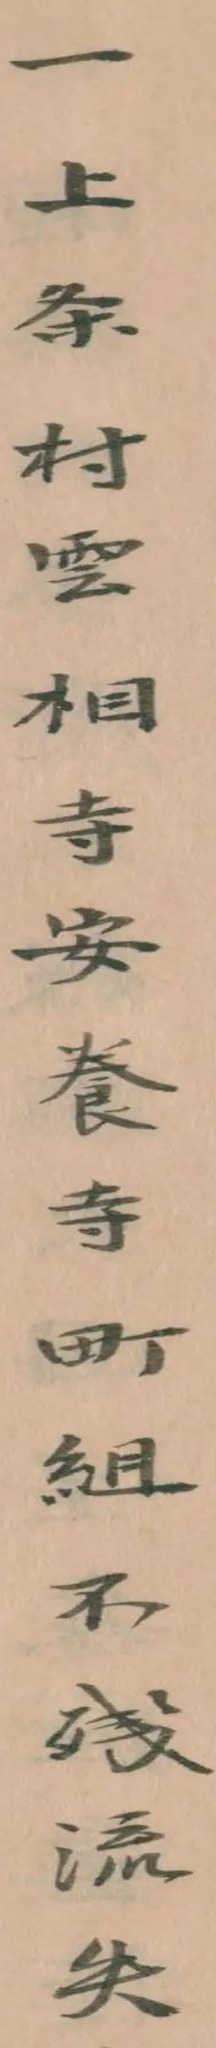一上条村雲相寺安養寺町組不残流失
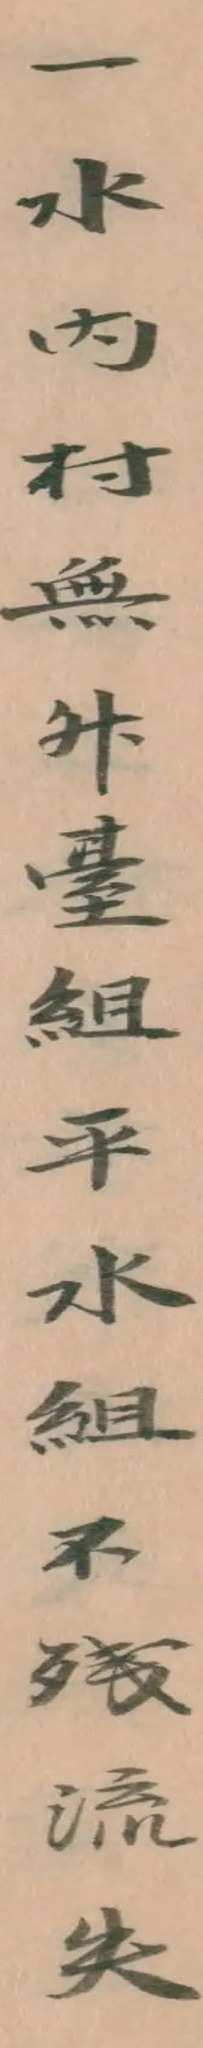一水内村無昇台組平水組不残流失
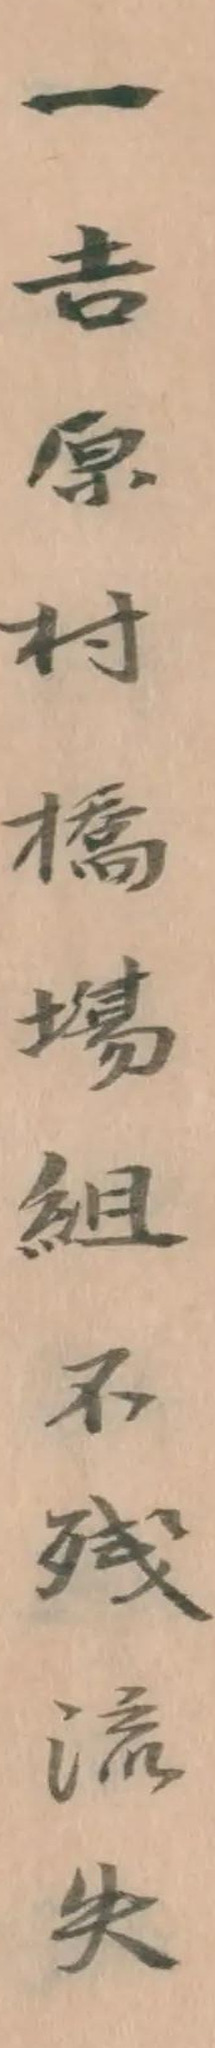一吉原村橋場組不残流失
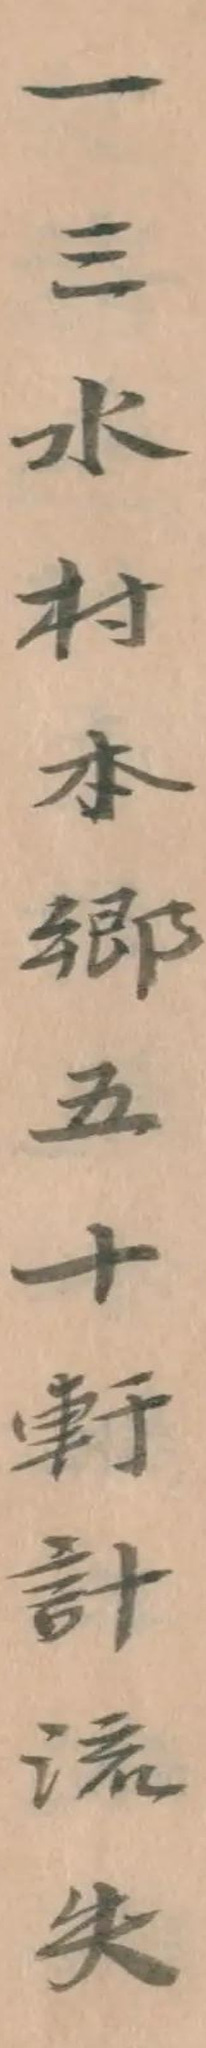一三水村本郷五十軒計流失
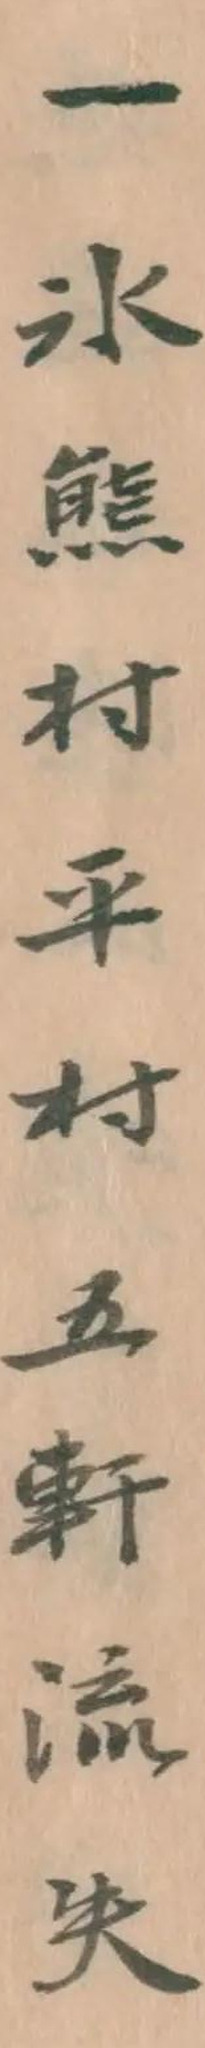一氷熊村平村五軒流失

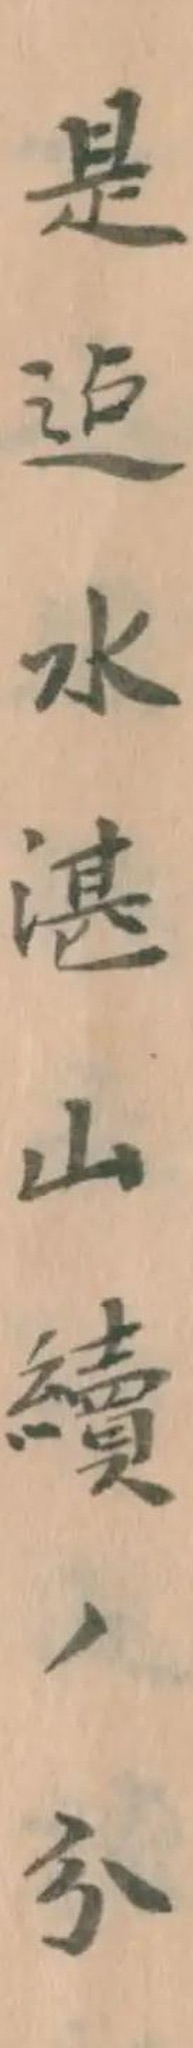是迄水湛山続ノ分
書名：地災撮要. 巻5-6(地震之部)
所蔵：国立国会図書館 National Diet Library, JAPAN
